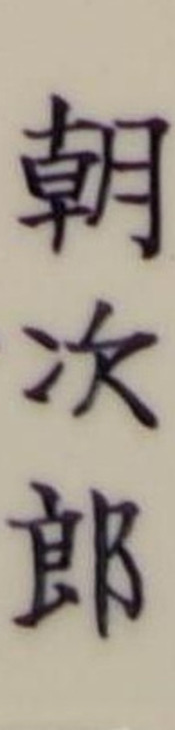朝次郎
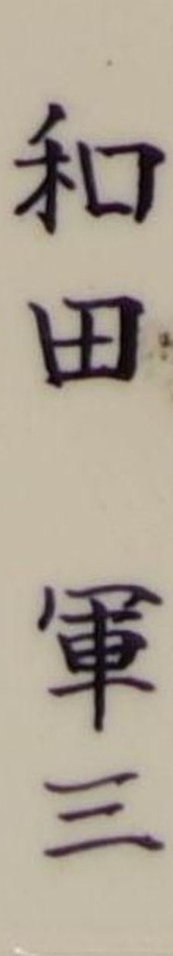和田軍三
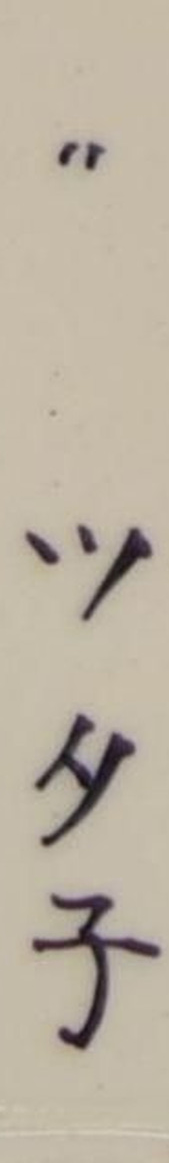ツタ子
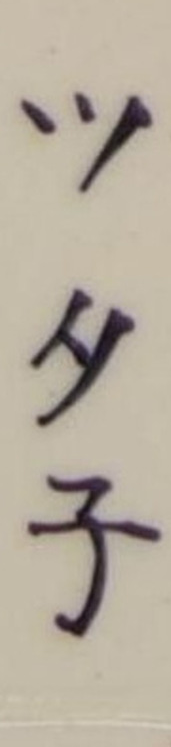ツタ子

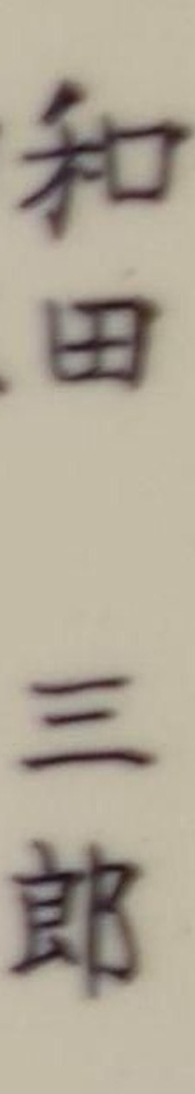和田三郎
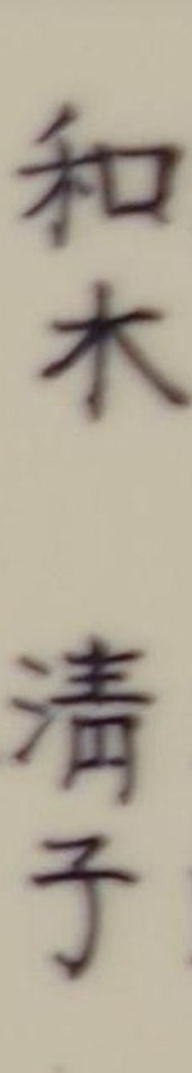和木清子
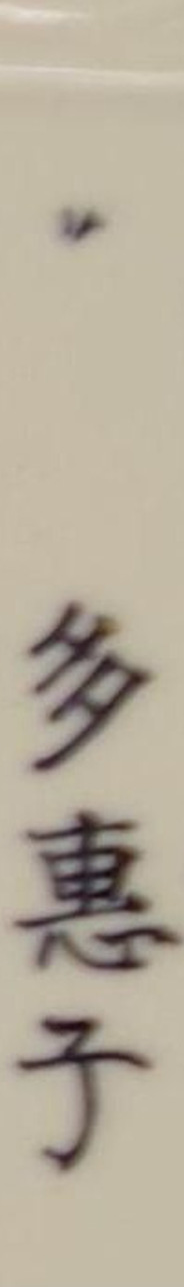多恵子
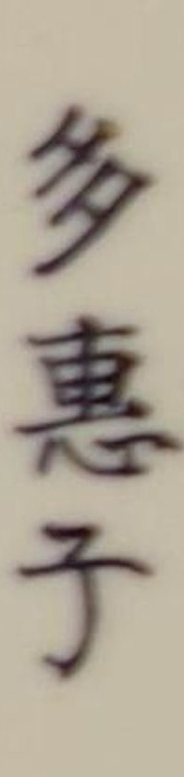多恵子
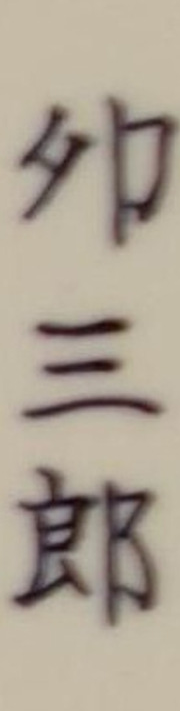卯三郎
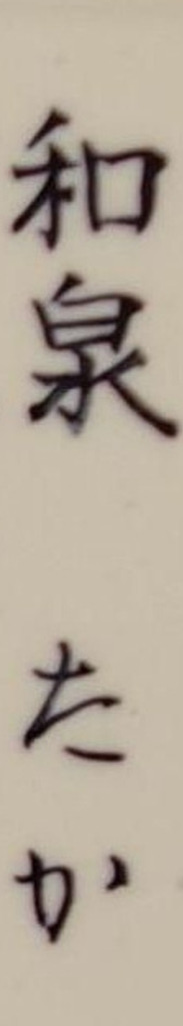和泉たか
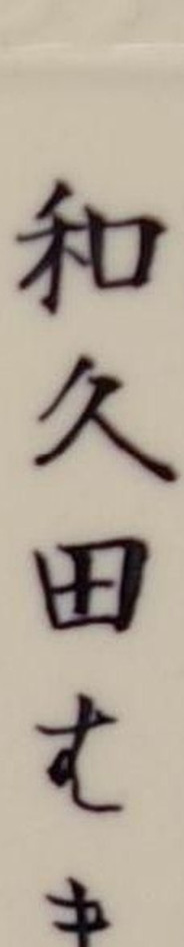和久田はま
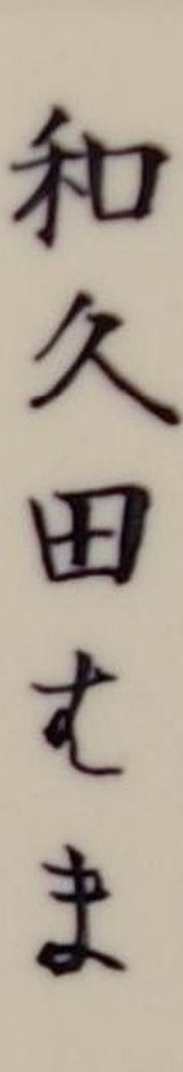和久田はま
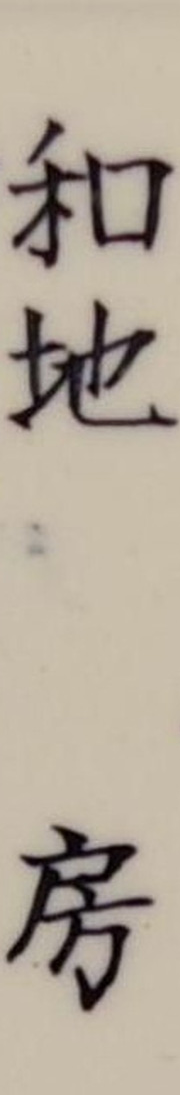和地房
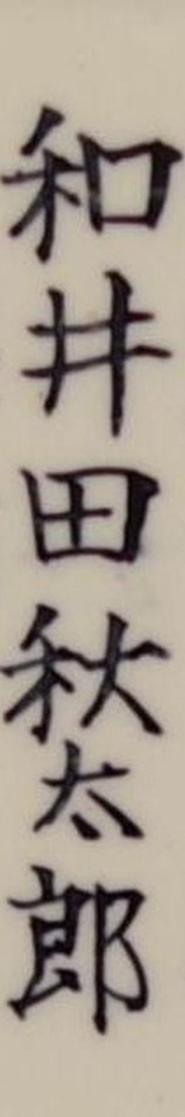和井田秋太郎
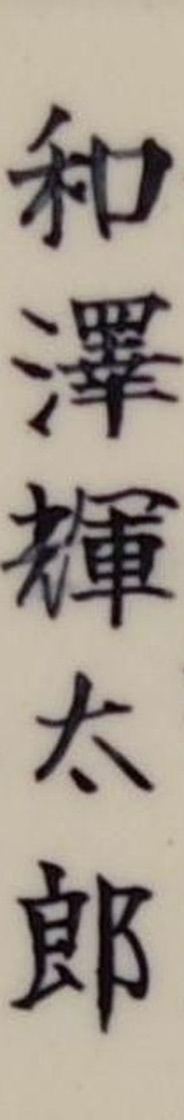和澤輝太郎
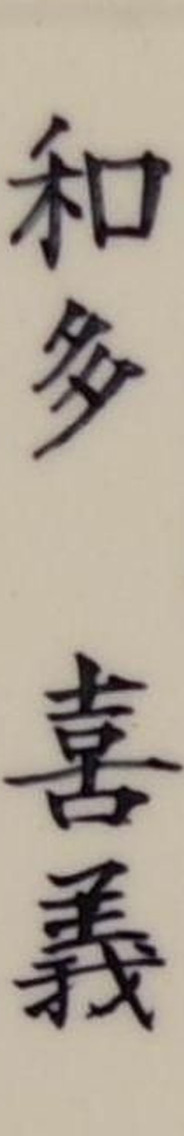和多喜善
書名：M~S
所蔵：高野山金剛峯寺
